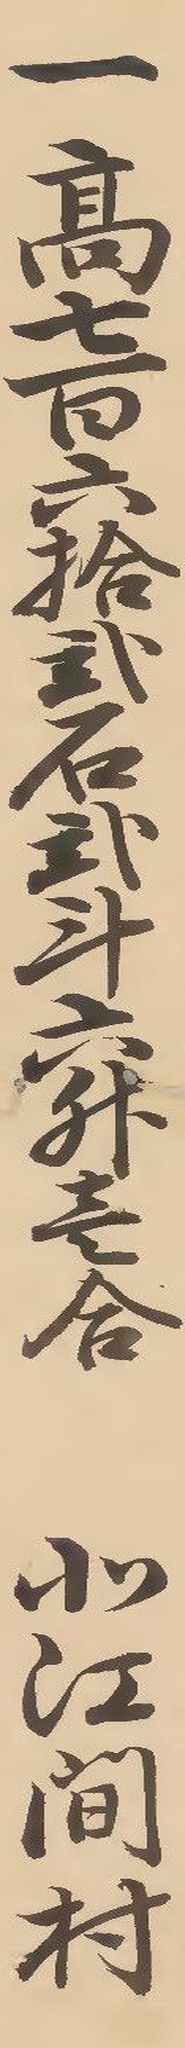一高七百六拾弐石弐斗六升壱合北江間村

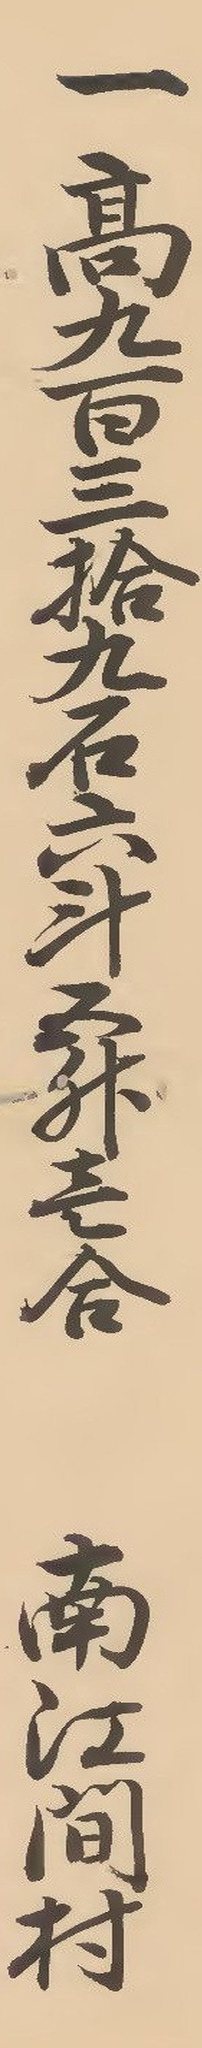一高九百三拾九石六斗五升壱合南江間村
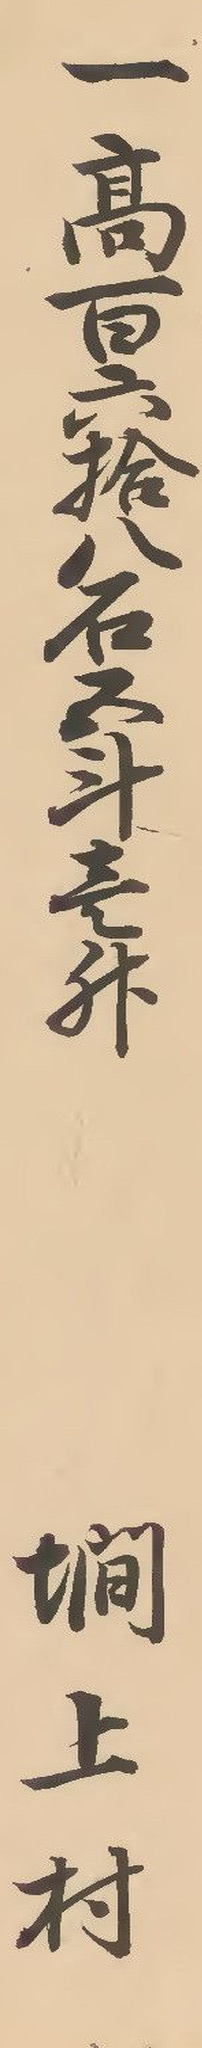一高百六拾八石五斗壱升墹上村
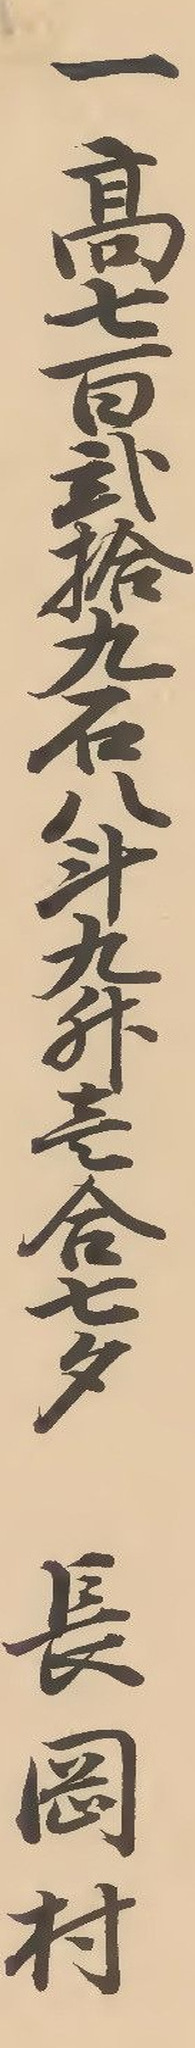一高七百弐拾九石八斗九升壱合七勺長岡村
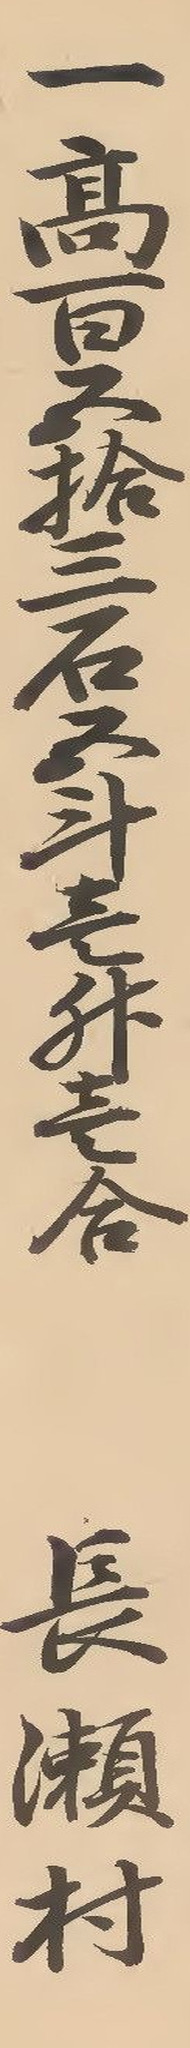一高百五拾三石五斗壱升壱合長瀬村
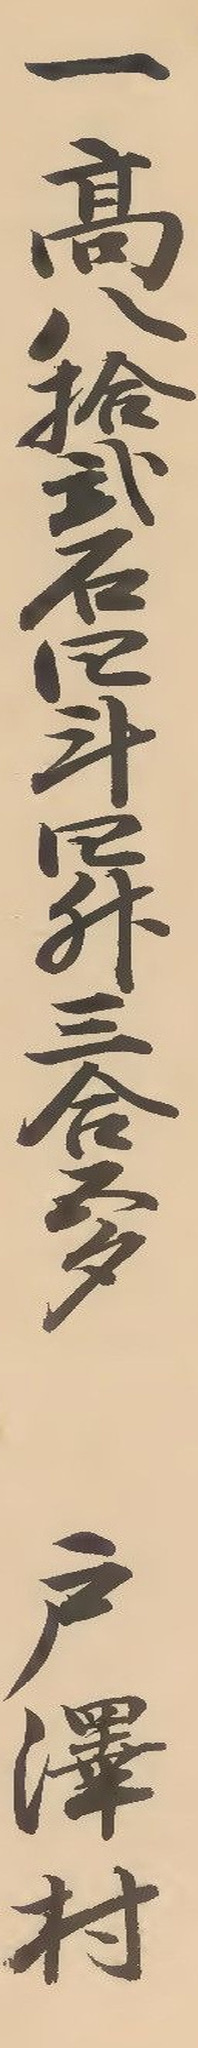一高八拾弐石四斗四升三合五勺戸沢村
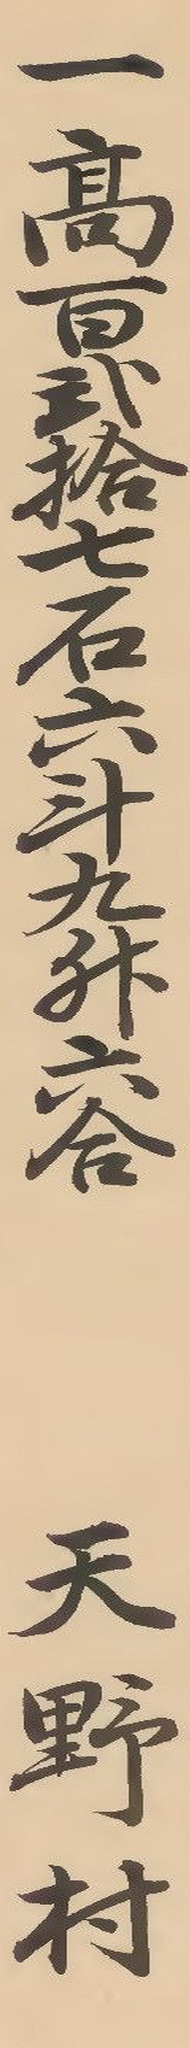一高百弐拾七石六斗九升六合天野村
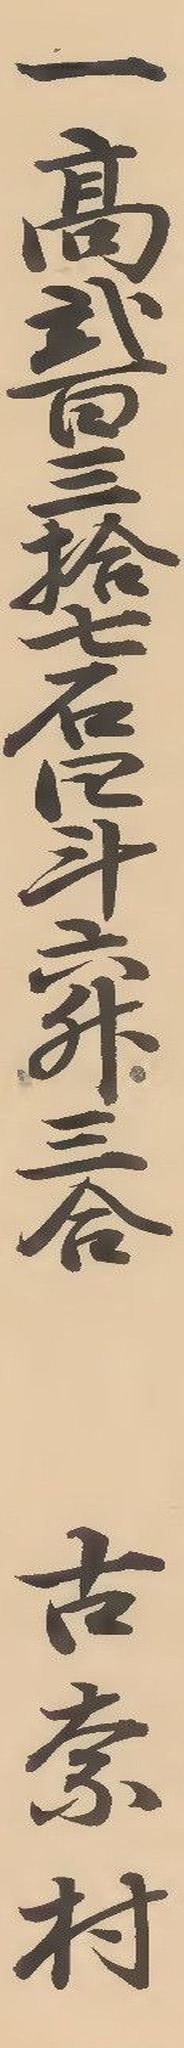一高弐百三拾七石四斗六升三合古奈村

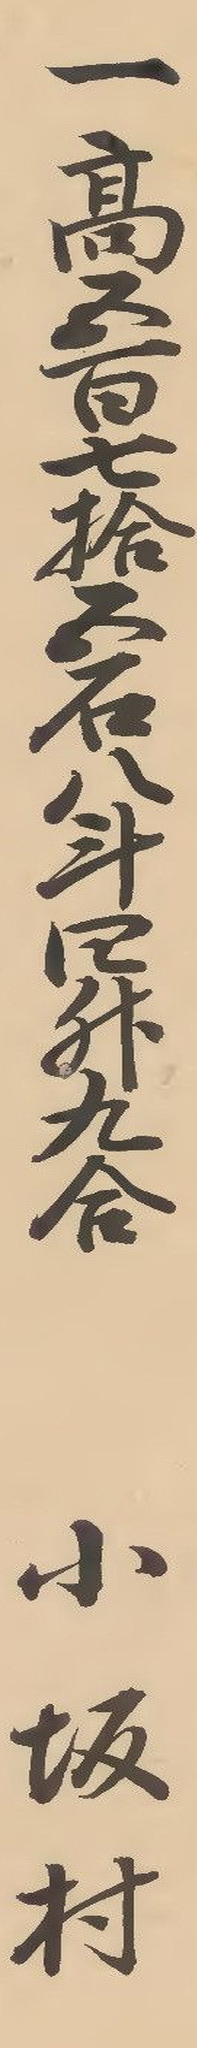一高五百七拾五石八斗四升九合小坂村
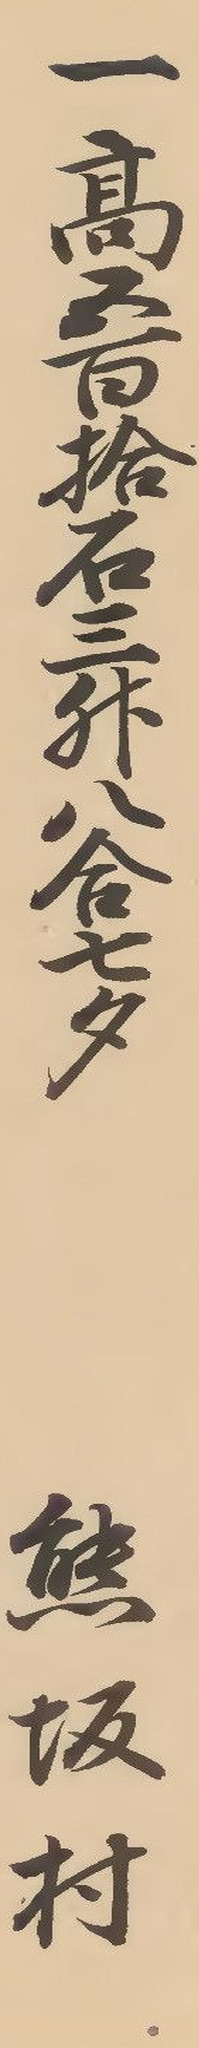一高五百拾石三升八合七勺熊坂村
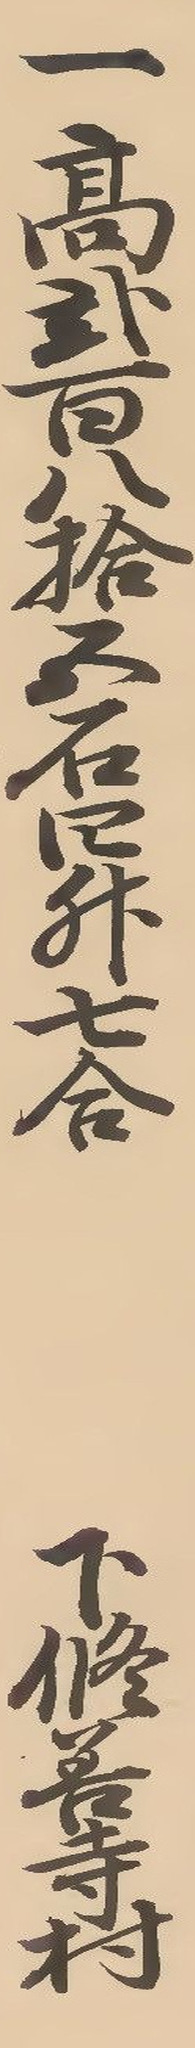一高弐百八拾五石四升七合下修善寺村
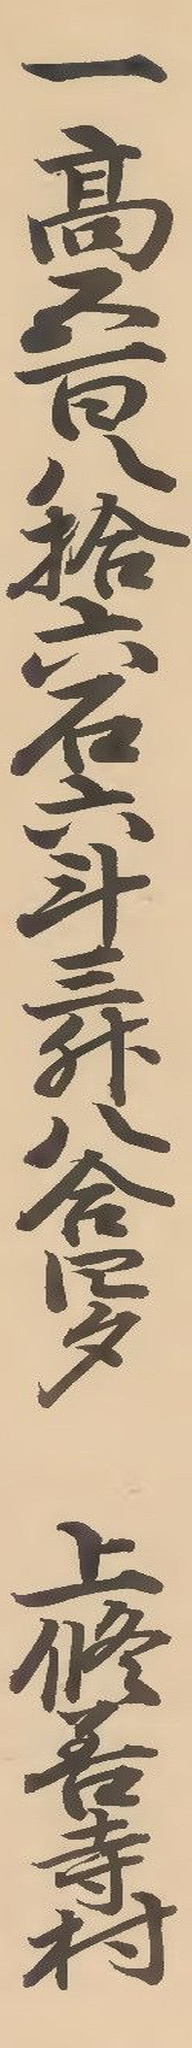一高五百八拾六石六斗三升八合四勺上修善寺村
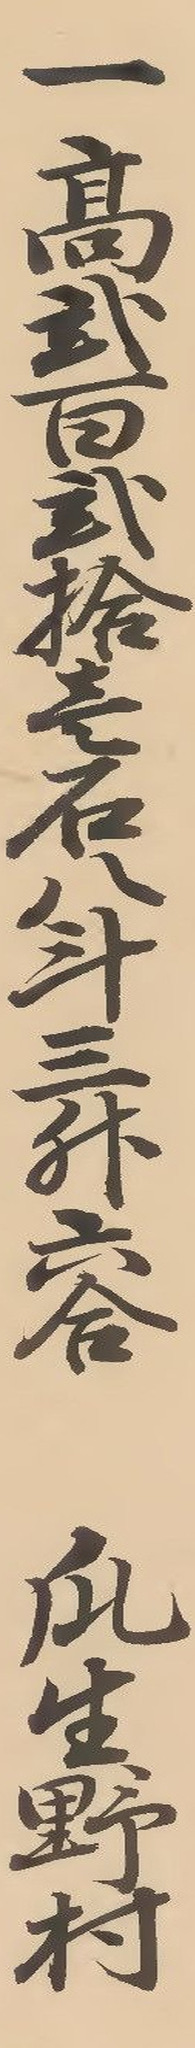一高弐百弐拾壱石八斗三升六合瓜生野村
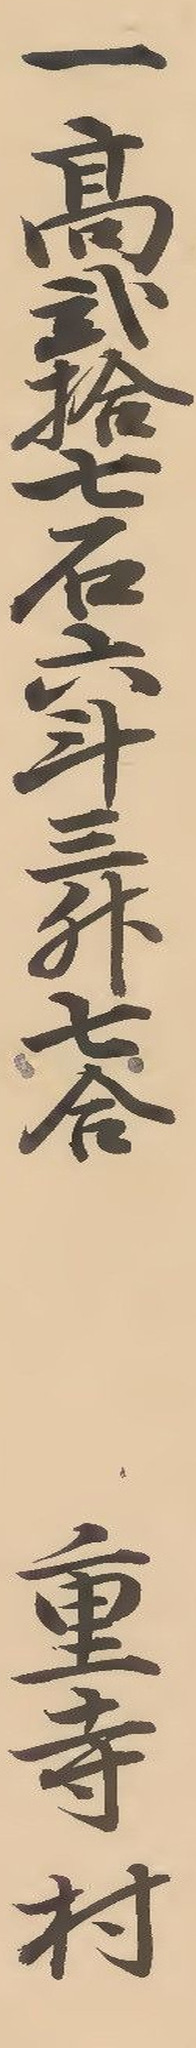一高弐拾七石六斗三升七合重寺村

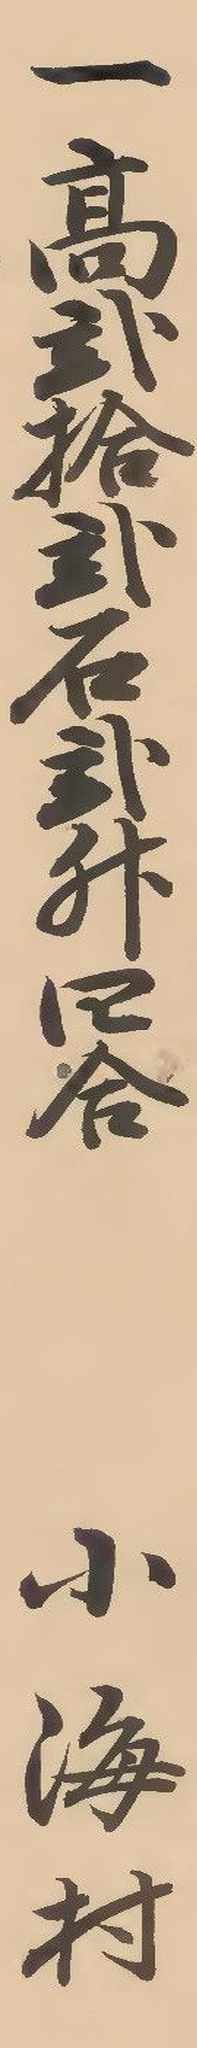一高弐拾弐石弐升四合小海村
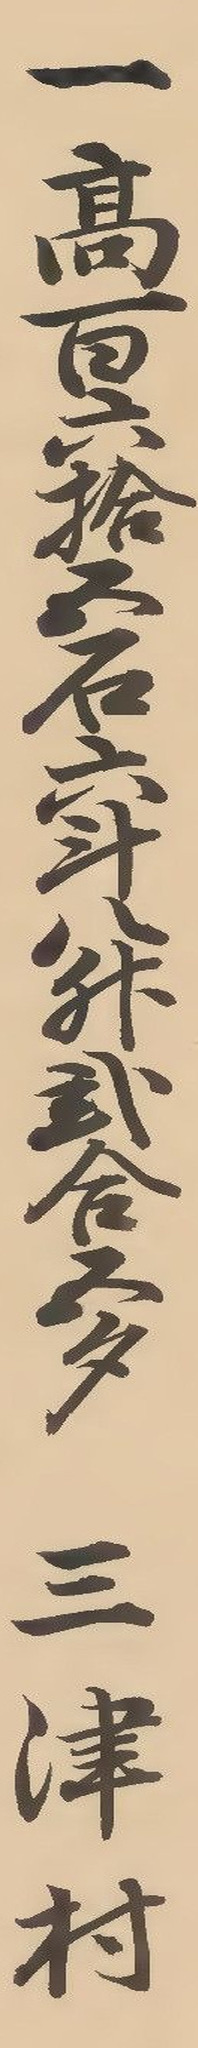一高百六拾五石六斗八升弐合五勺三津村
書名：伊豆国郷帳
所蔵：国立公文書館 National Archives of Japan
